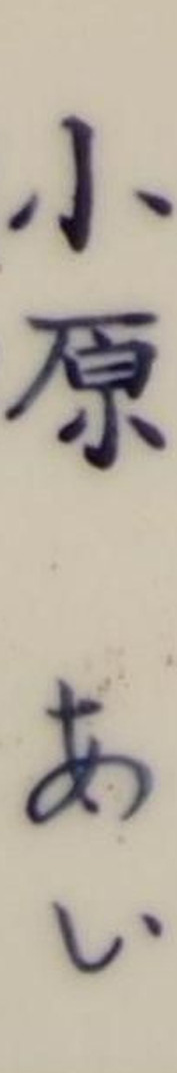小原あい
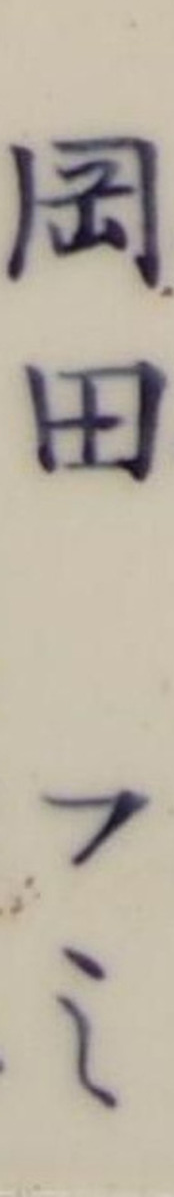岡田フミ
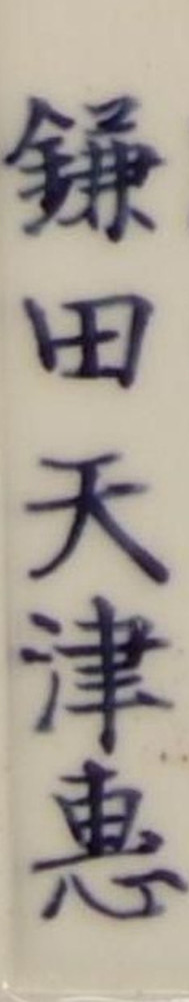鎌田天津恵

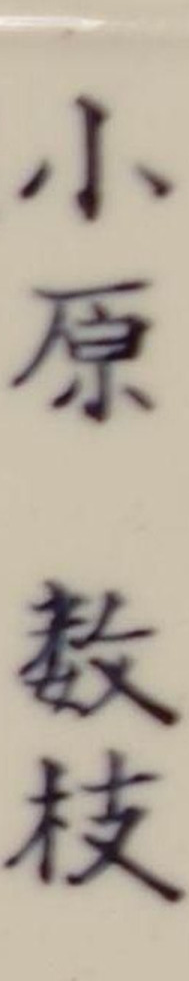小原数枝
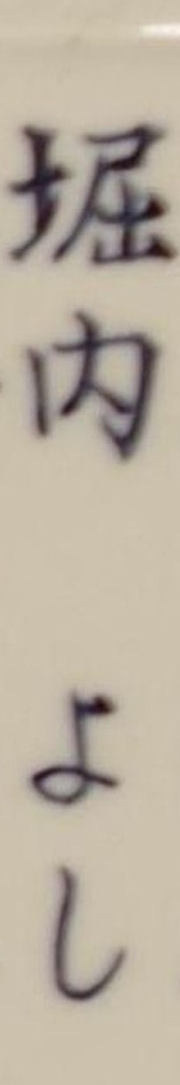堀内よし
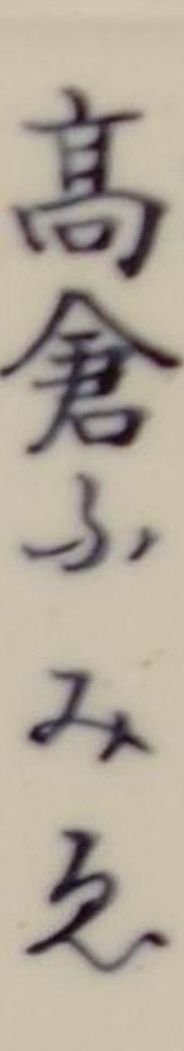高倉ふみゑ
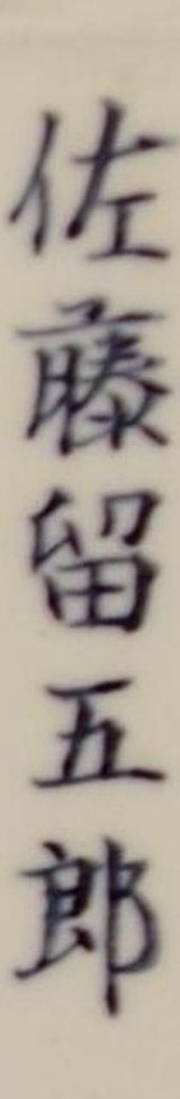佐藤留五郎
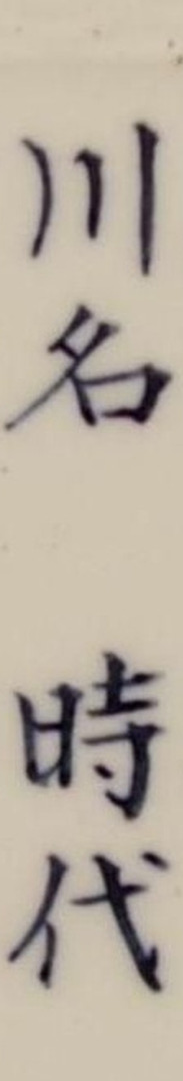川名時代
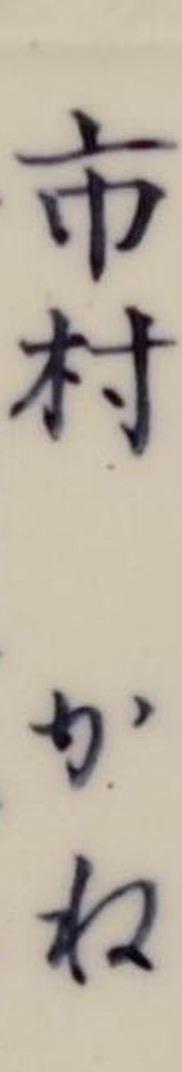市村かね
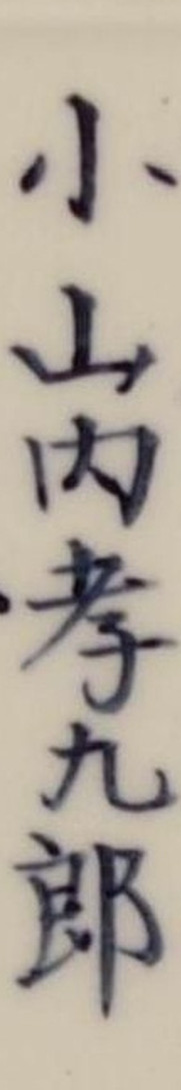小山内孝九郎
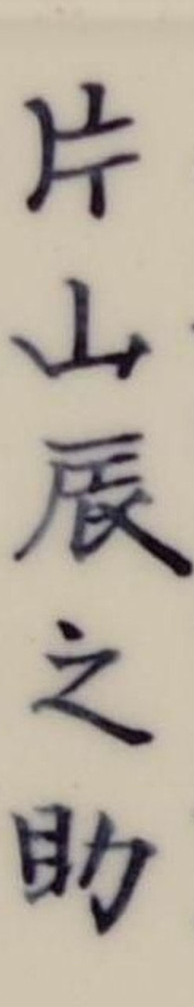片山辰之助
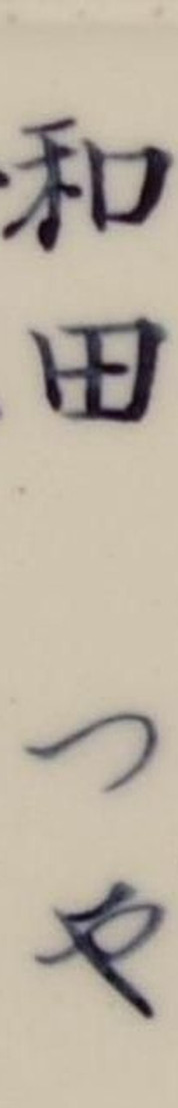和田つや
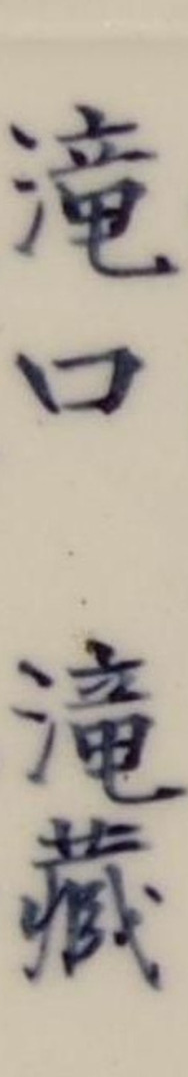滝口滝蔵
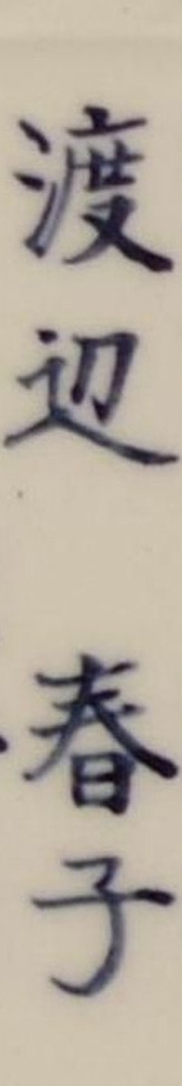渡辺春子
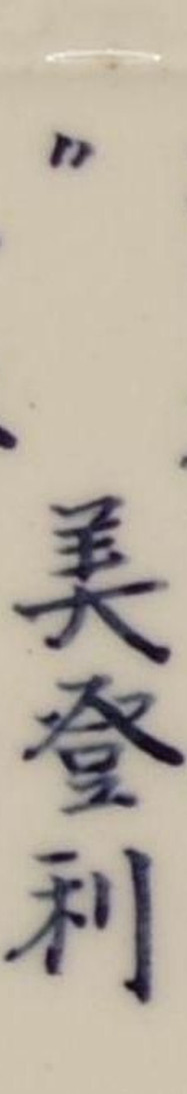美登利
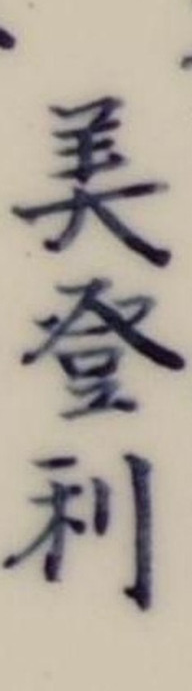美登利
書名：M~S
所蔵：高野山金剛峯寺
